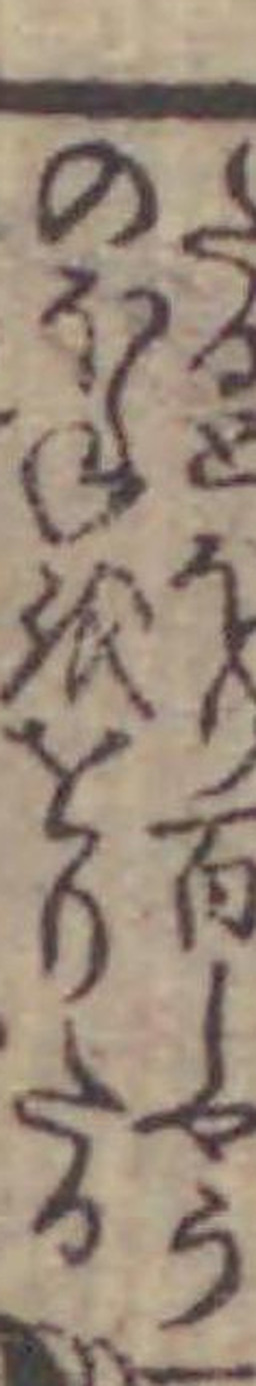のほねをとりたる
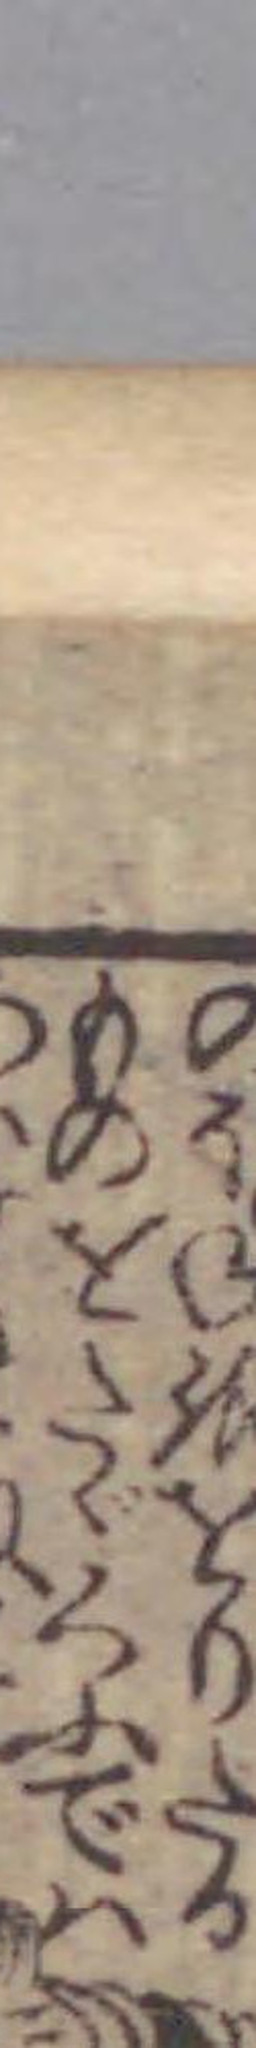ものをたゞくふでは
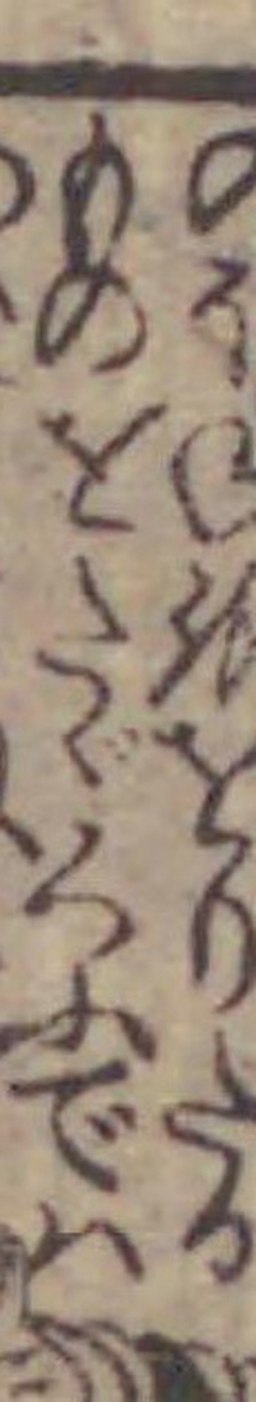ものをたゞくふでは
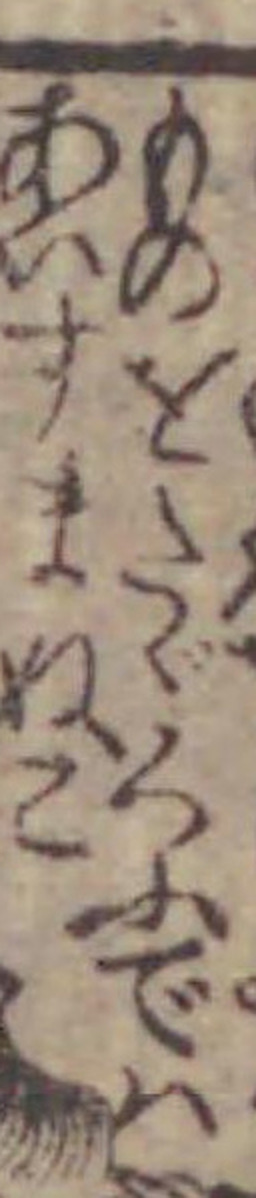あいすまぬこ
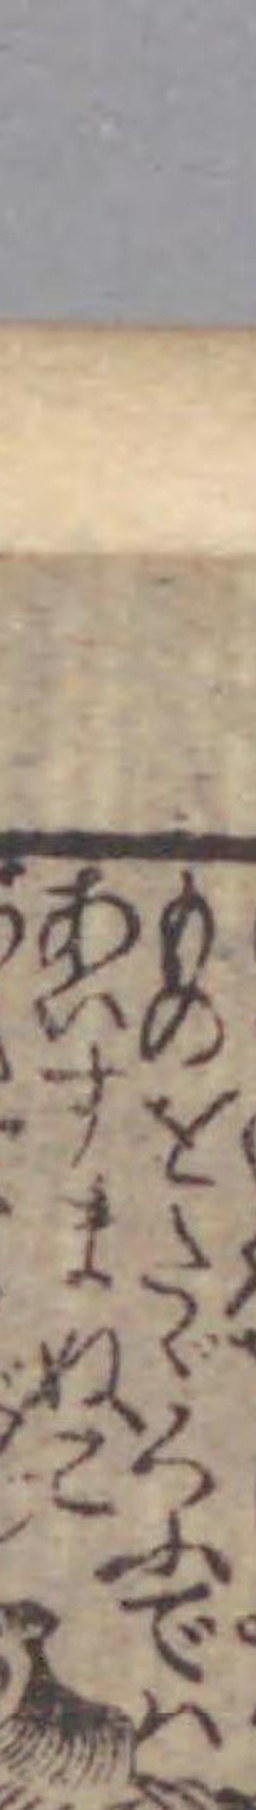あいすまぬこ
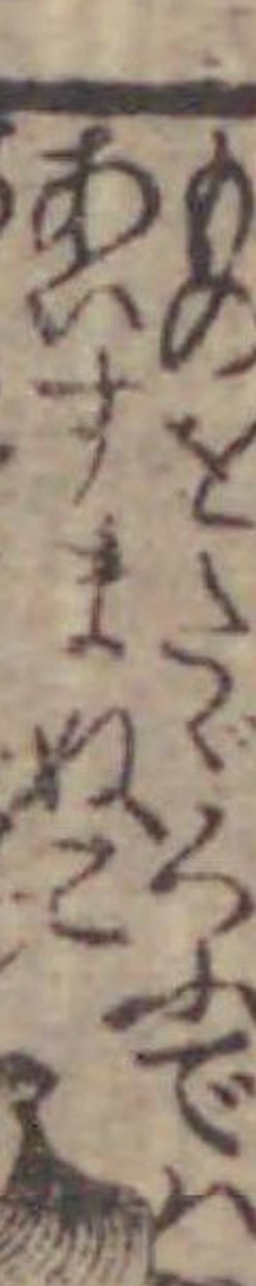あいすまぬこ
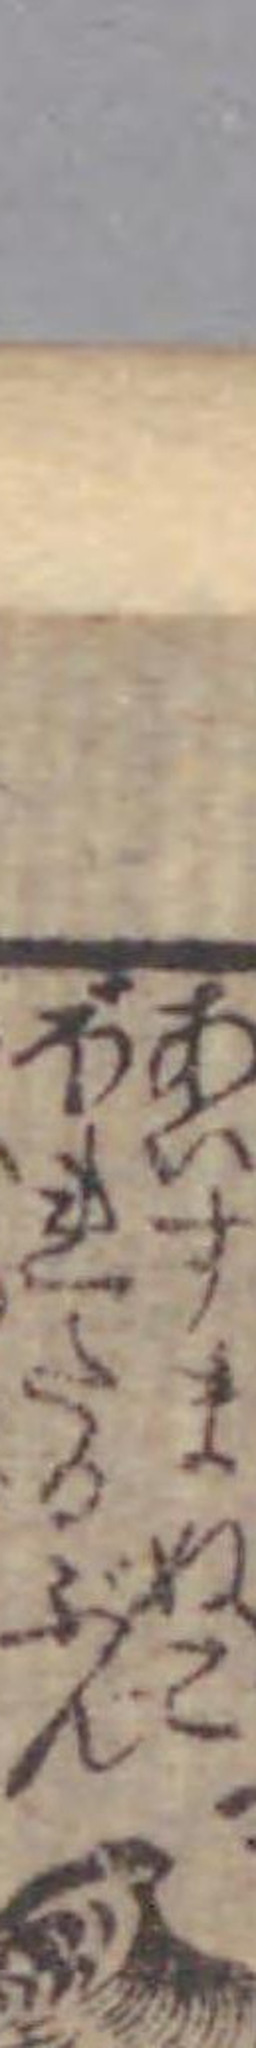ぼれたるぶん
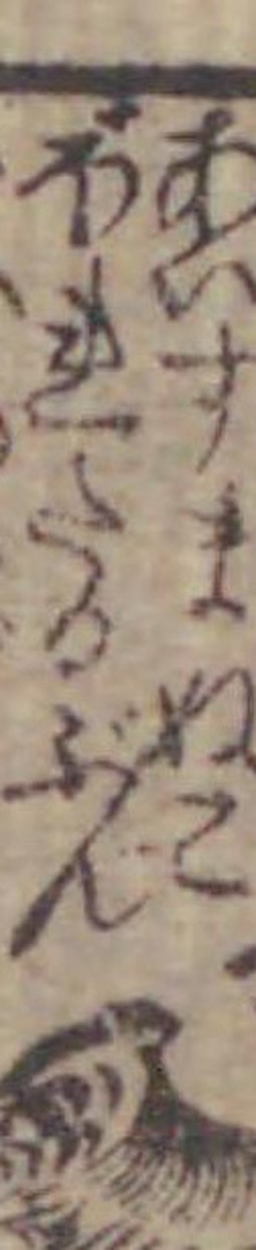ぼれたるぶん
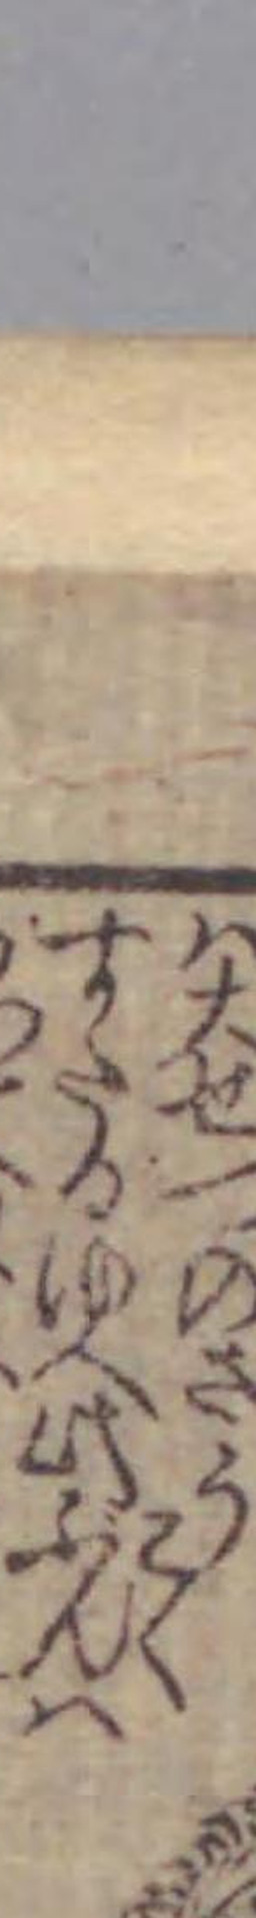すたるゆへ此ぶんは
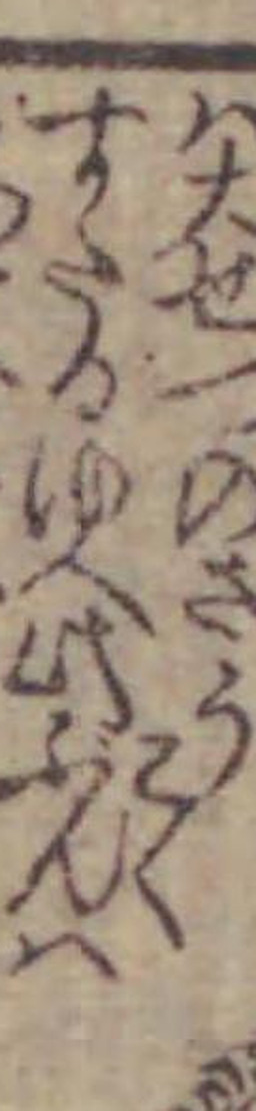すたるゆへ此ぶんは
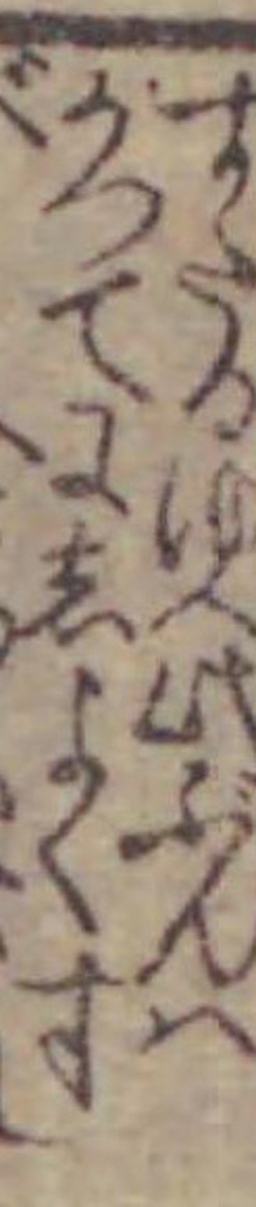かつてにしよくす
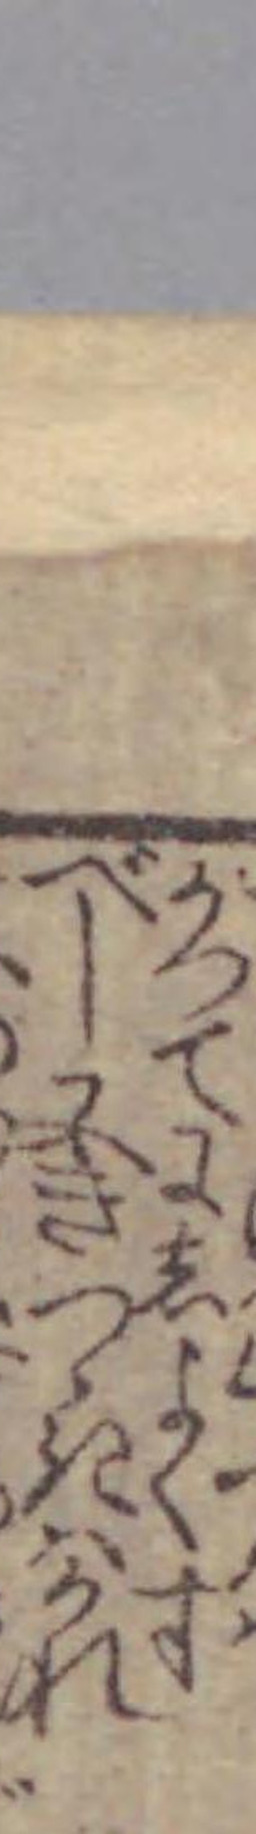べし又きつゝきはかれ
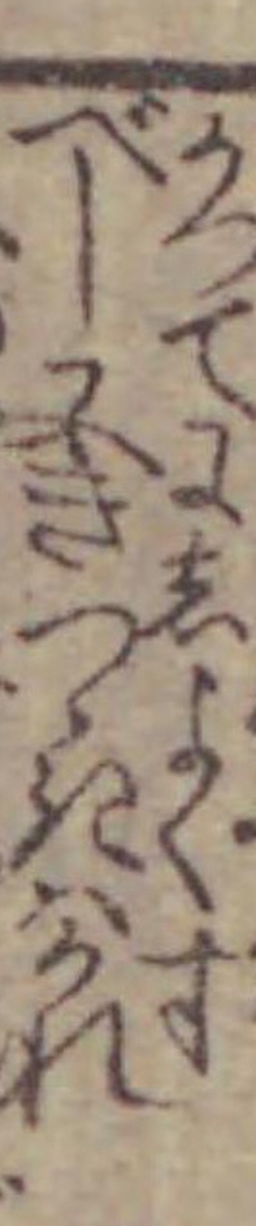べし又きつゝきはかれ
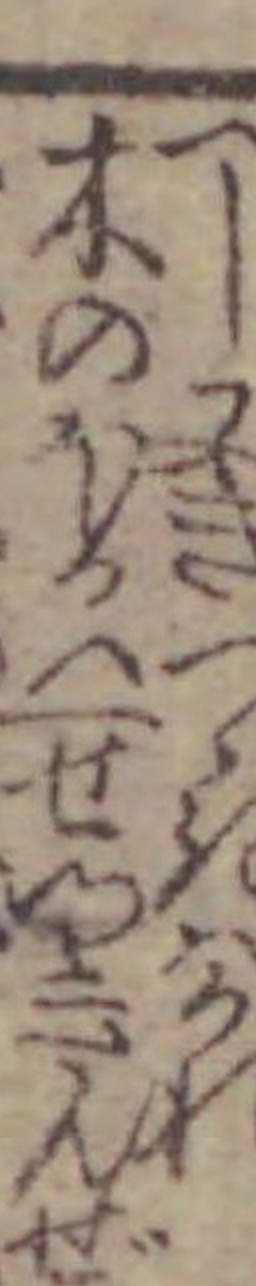木のほかは一せつきんぜい
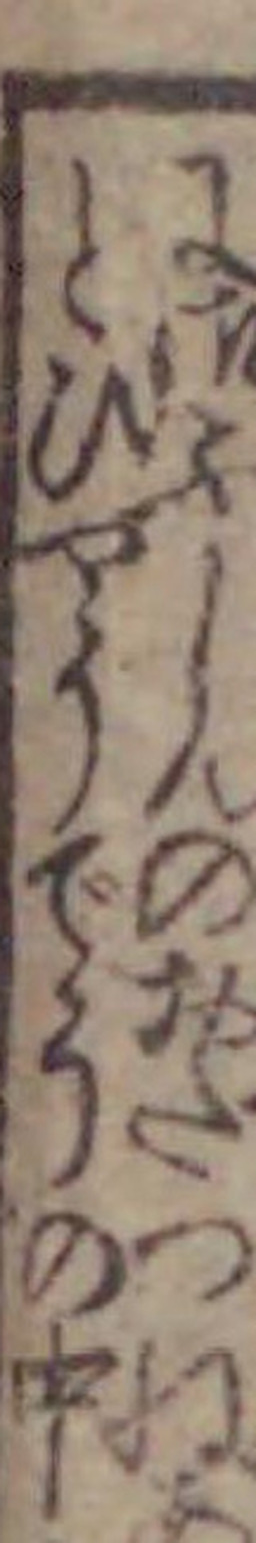とひやうでうの中へ
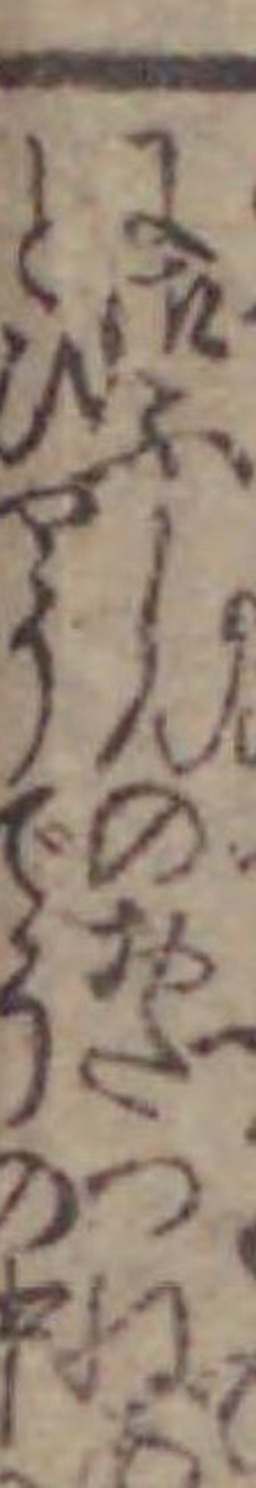とひやうでうの中へ
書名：即席耳学問 : 3巻
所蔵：国立国会図書館 National Diet Library, JAPAN
